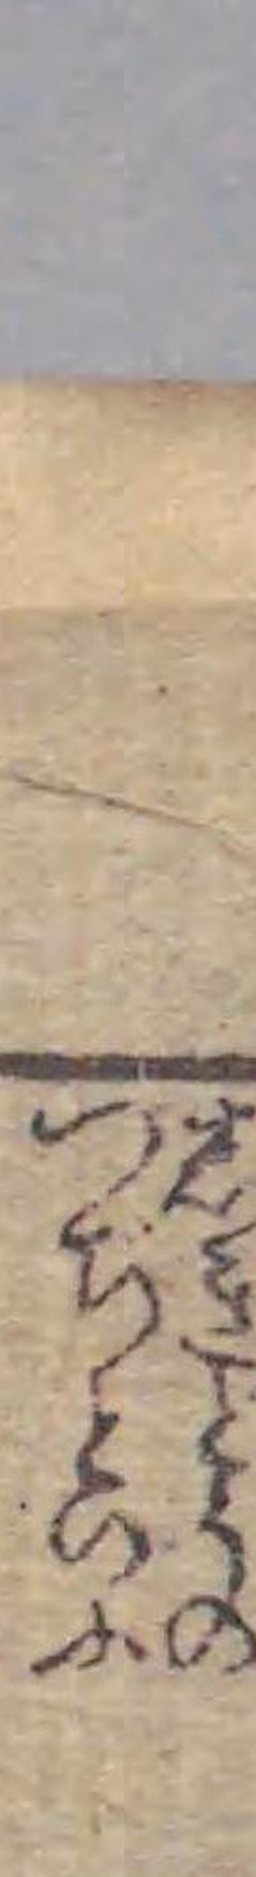つぢといふ
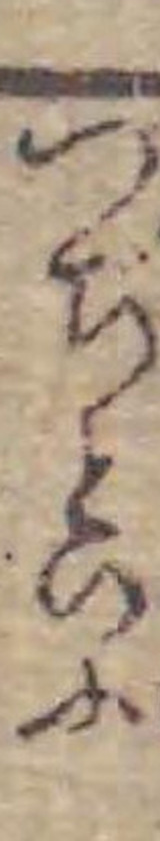つぢといふ
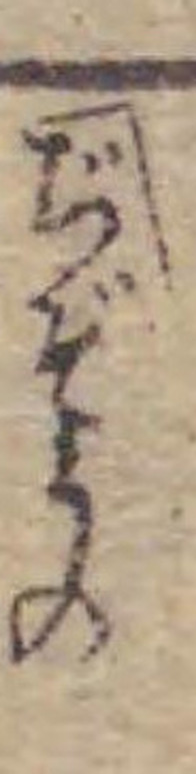〽ぢぞうの
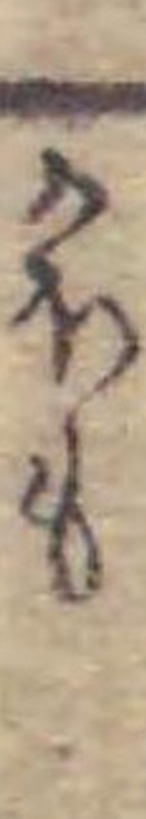かほも
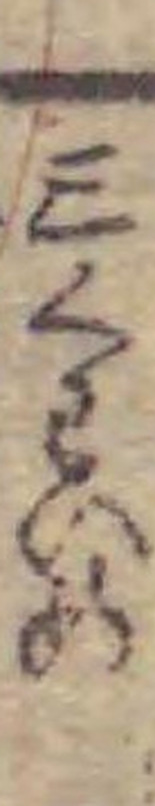三くわいめ
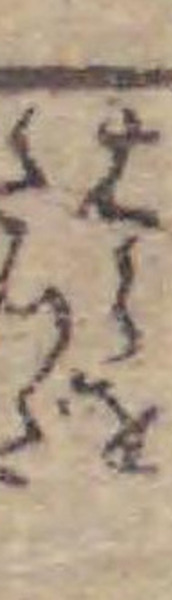はらを
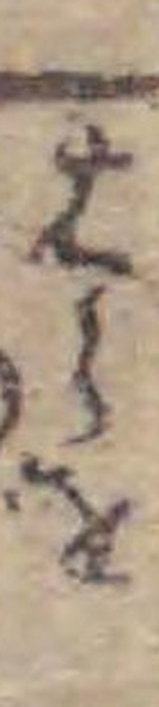はらを
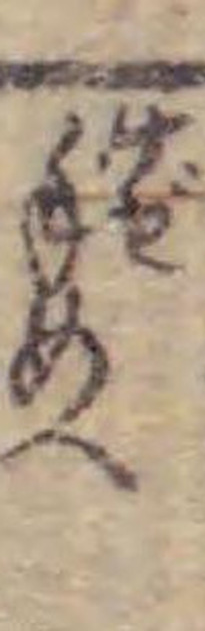てめへ
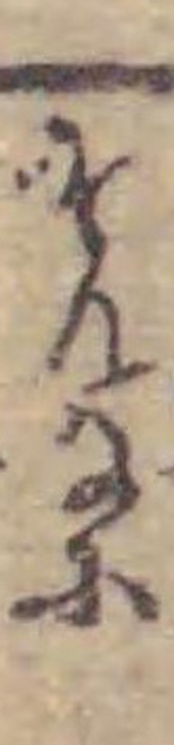そんなに

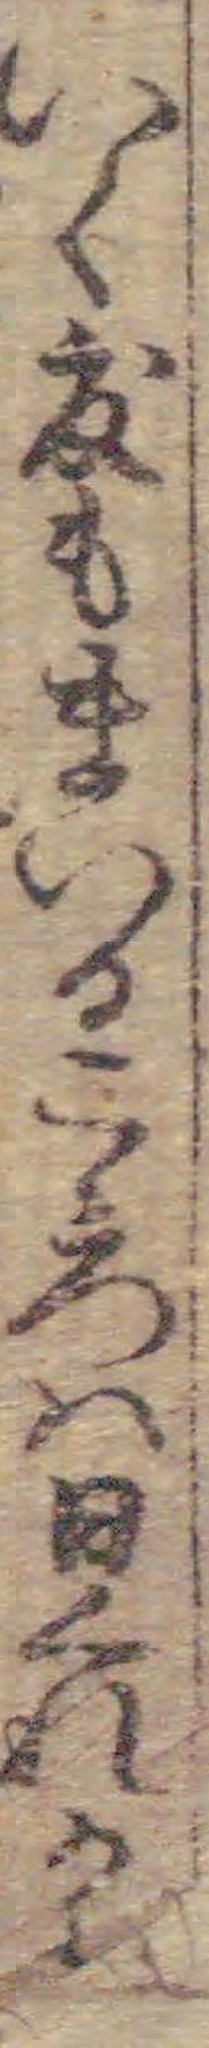いく夏もまいるこゝろは日くれから
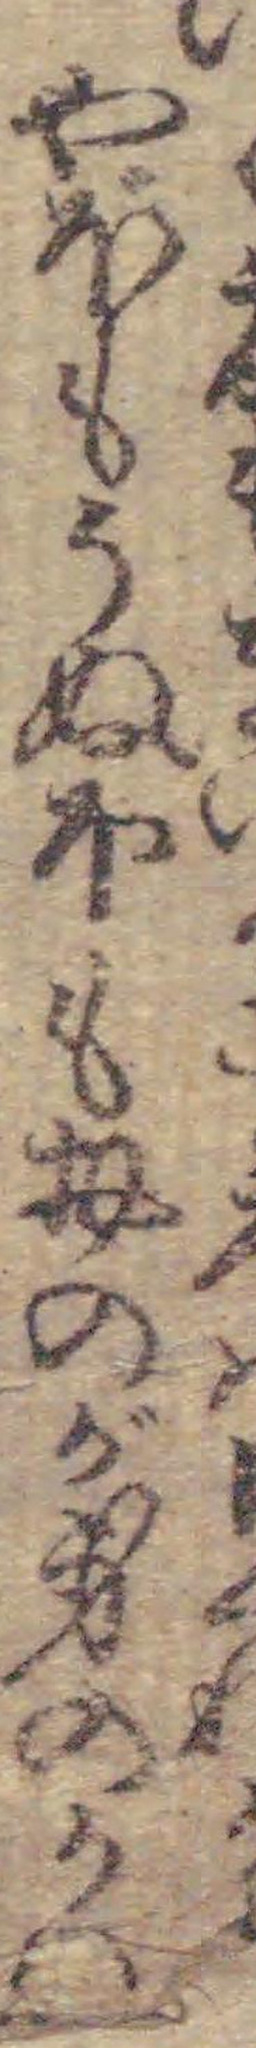やぼもうぬほもおのがみのかは
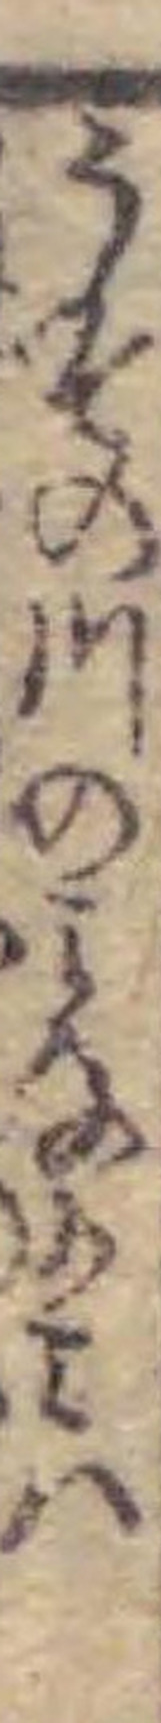うその川のみなかみは
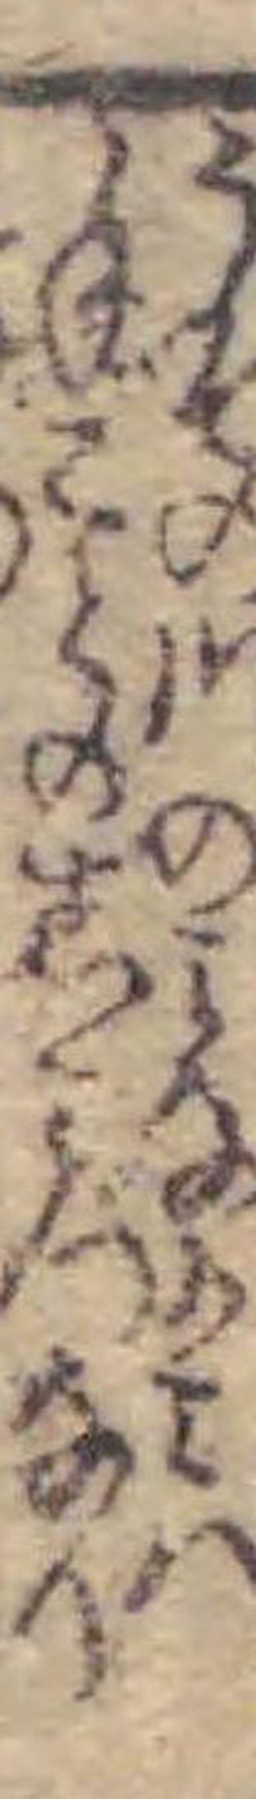手ごとのしみづなり
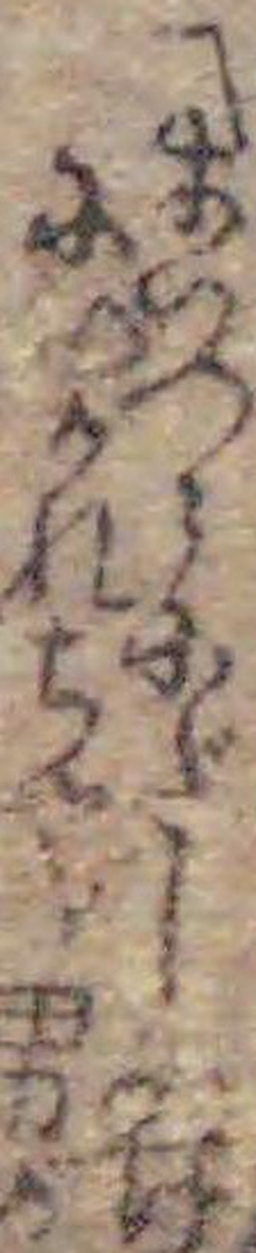にいかれちやァ男が
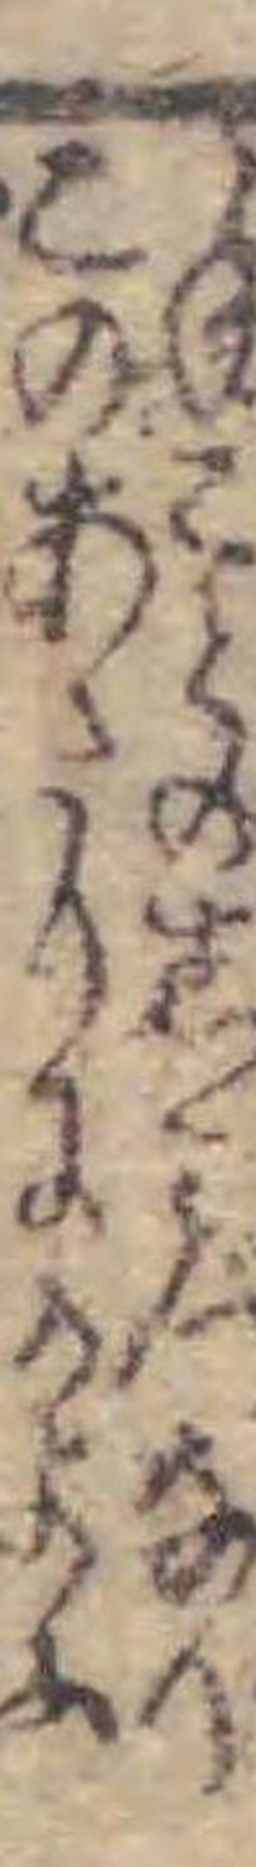このあたりにかよふ
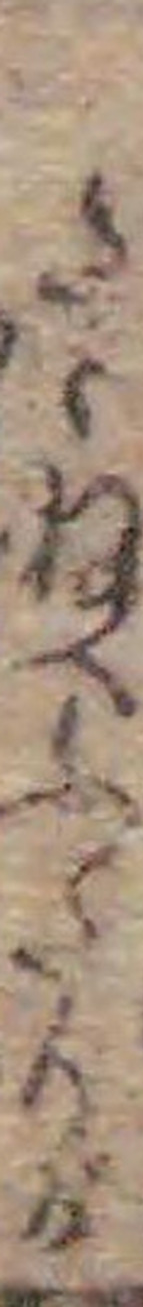たゝねへふたりが
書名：北国順礼唄方便 : 3巻
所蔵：国立国会図書館 National Diet Library, JAPAN
